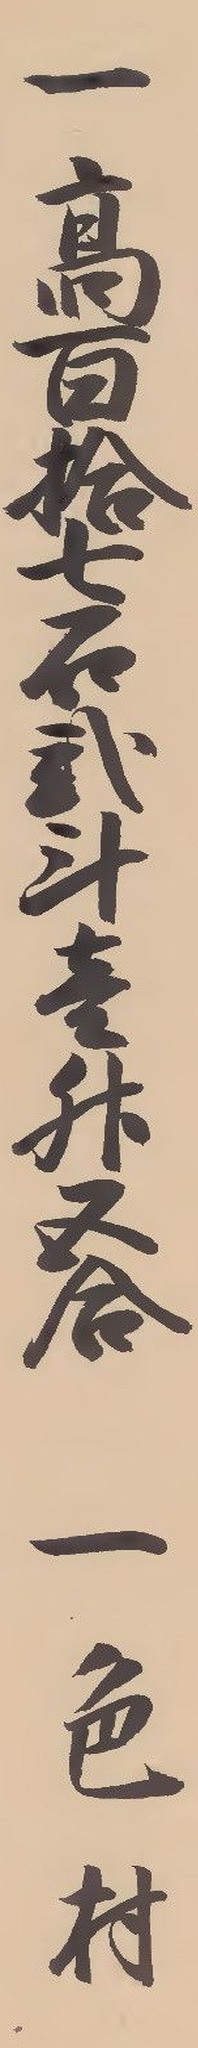一高百拾七石弐斗壱升五合一色村
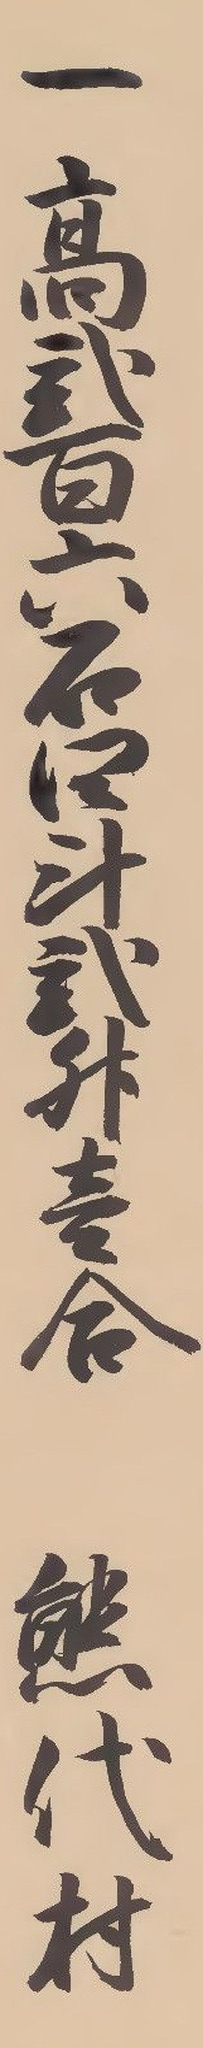一高弐百六石四斗弐升壱合熊代村
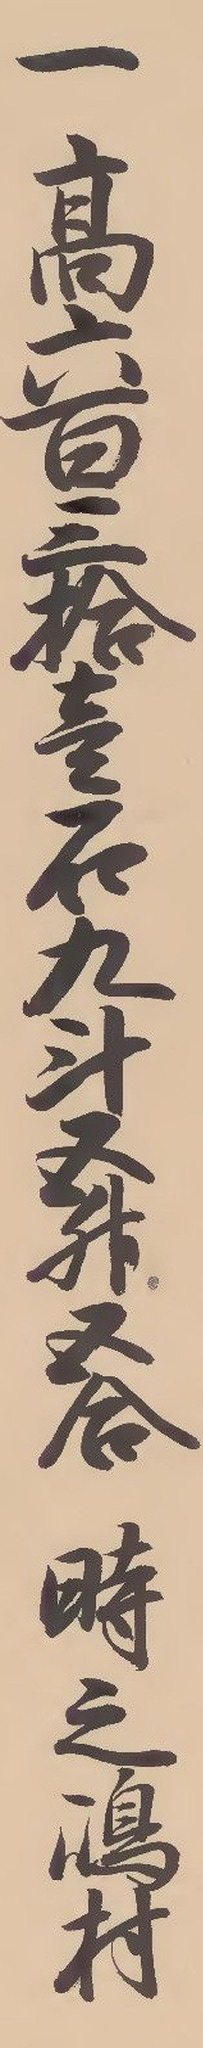一高六百三拾壱石九斗五升五合時之島村

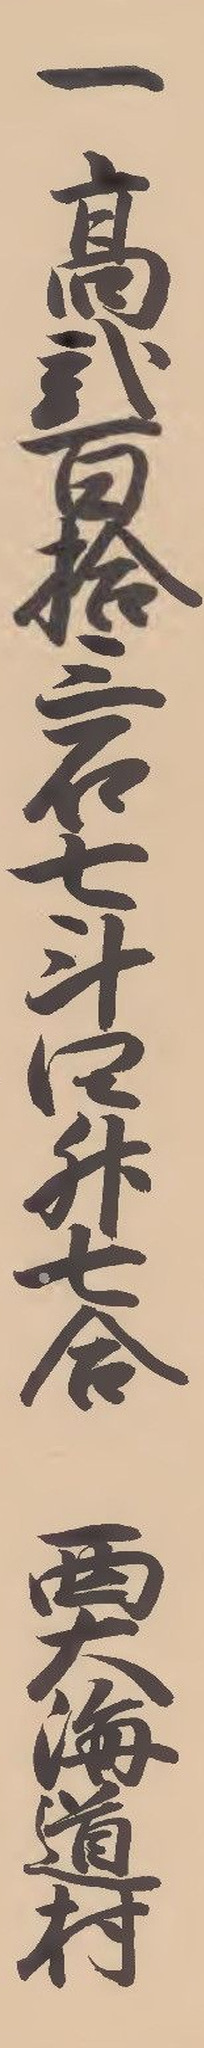一高弐百拾三石七斗四升七合西大海道村
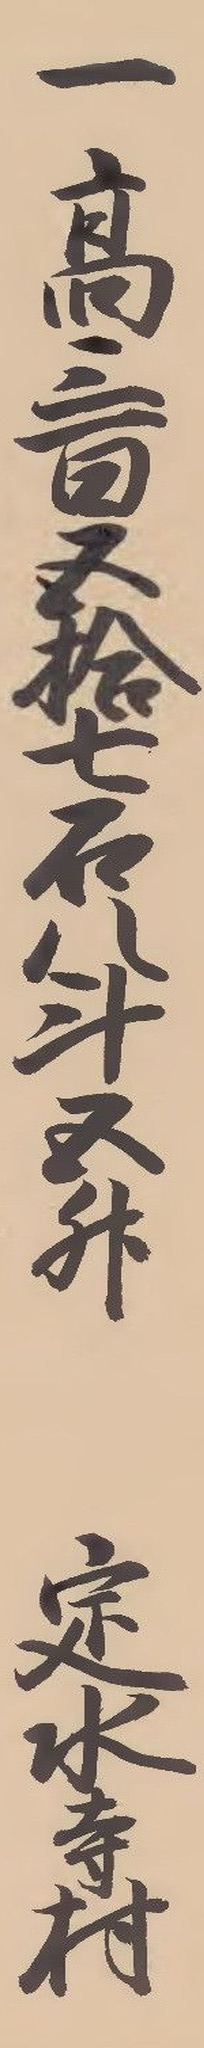一高三百五拾七石八斗五升定水寺村
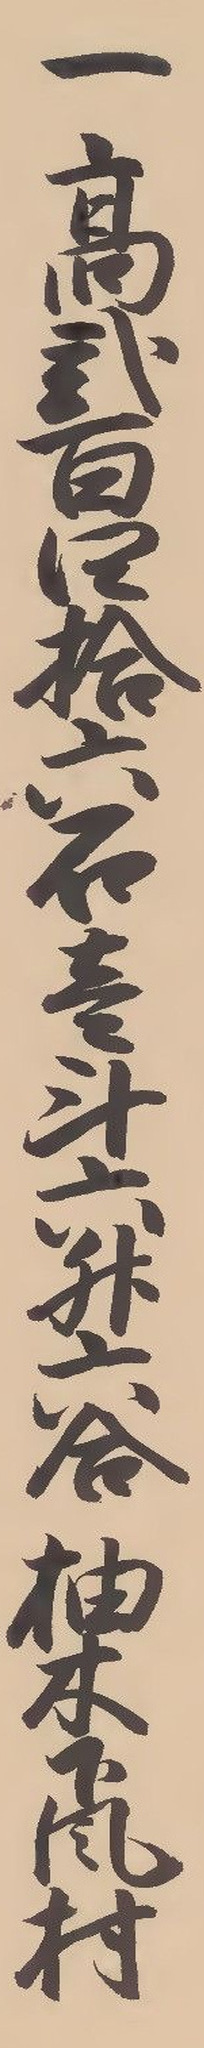一高弐百四拾六石壱斗六升六合柚木颪村
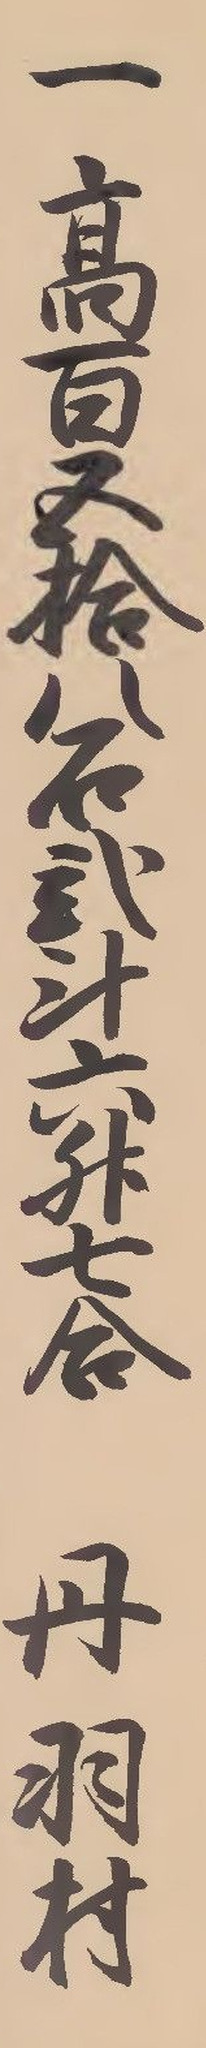一高百五拾八石弐斗六升七合丹羽村
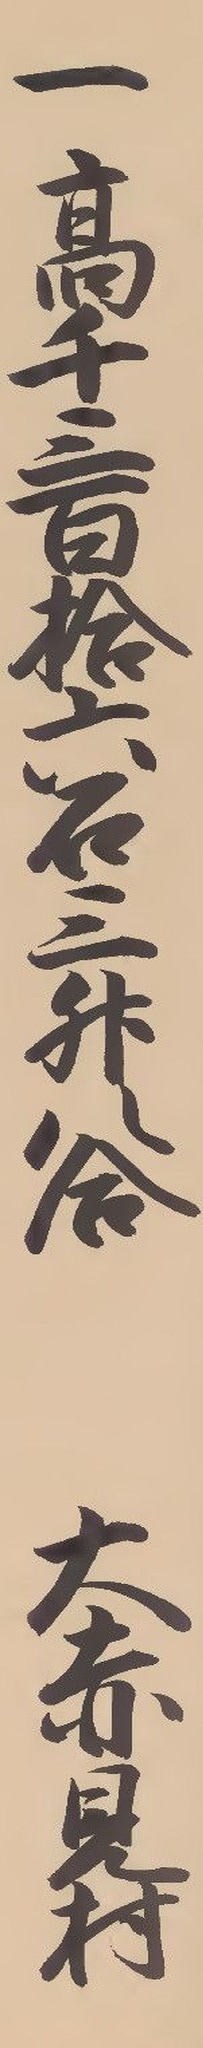一高千三百拾六石三升八合大赤見村
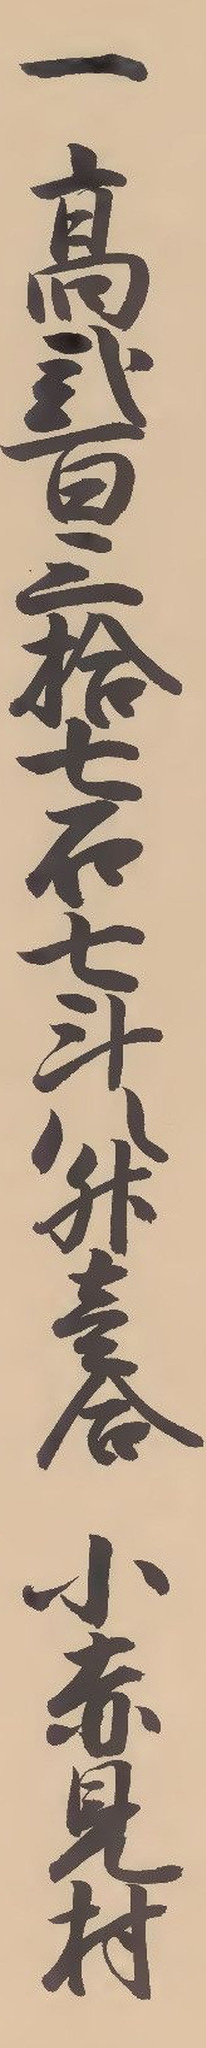一高弐百三拾七石七斗八升壱合小赤見村
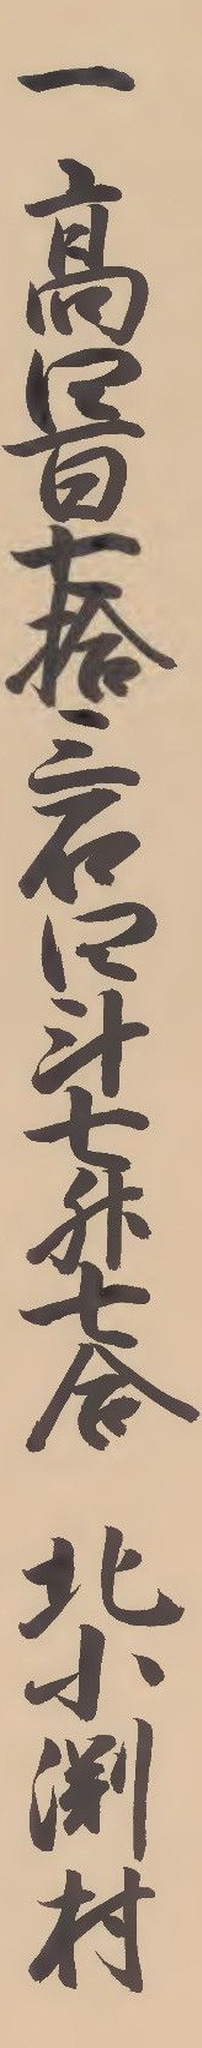一高四百七拾三石四斗七升七合北小渕村
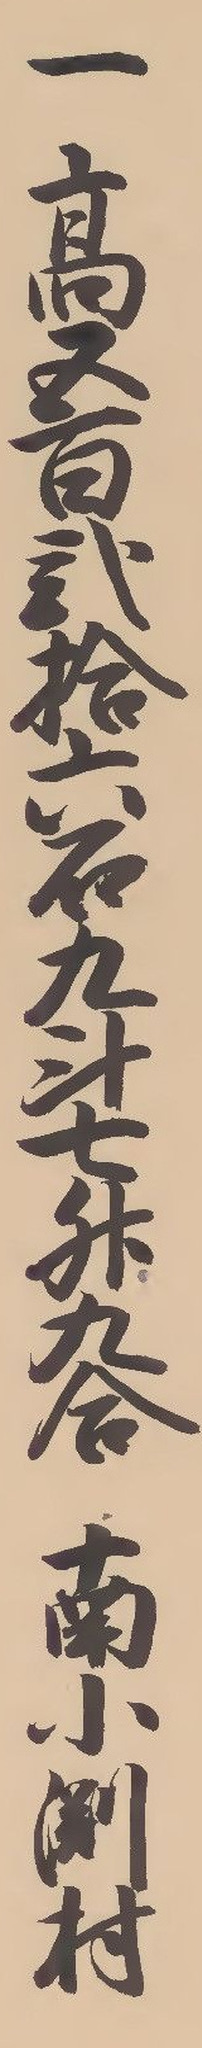一高五百弐拾六石九斗七升九合南小渕村

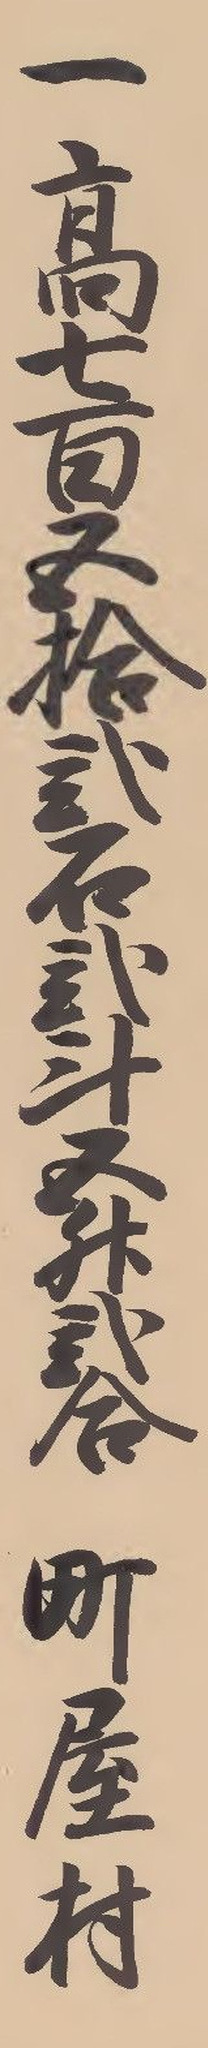一高七百五拾弐石弐斗五升弐合町屋村
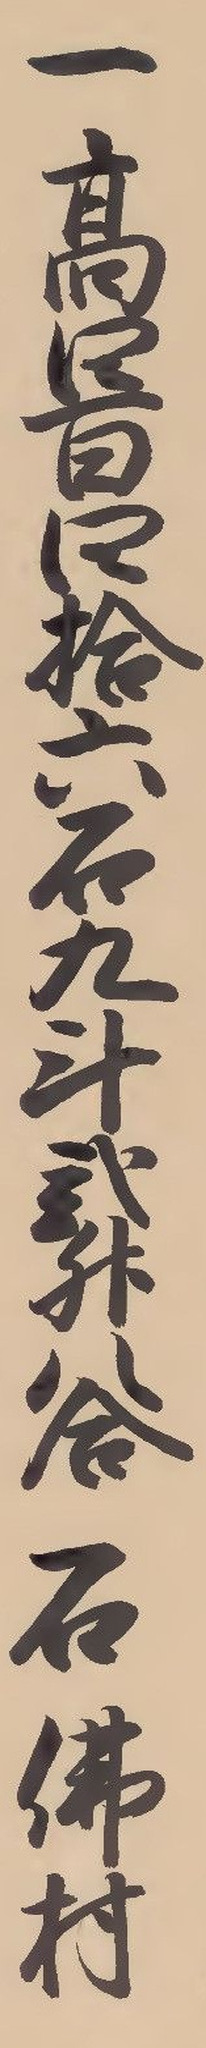一高四百四拾六石九斗弐升八合石仏村
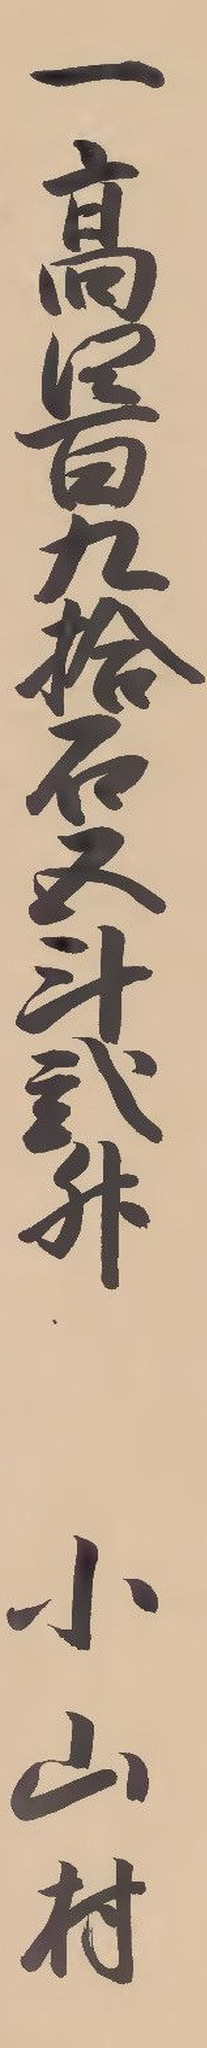一高四百九拾石五斗弐升小山村
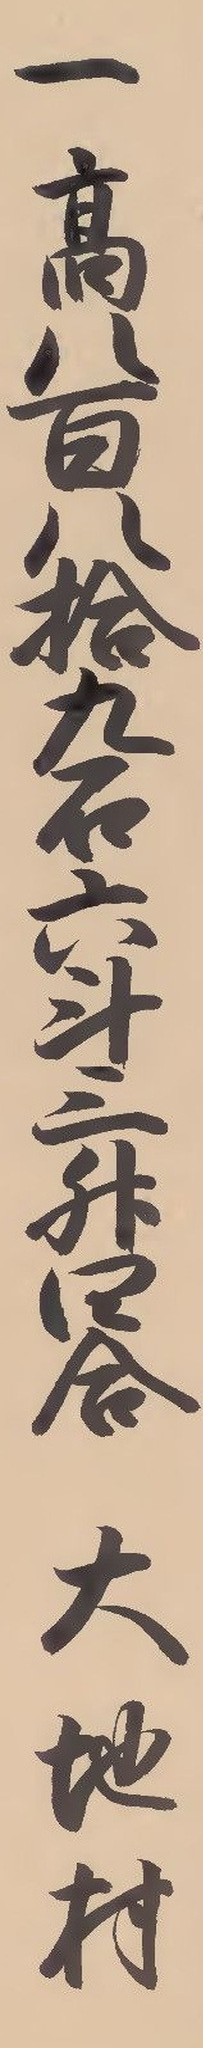一高八百八拾九石六斗三升四合大地村
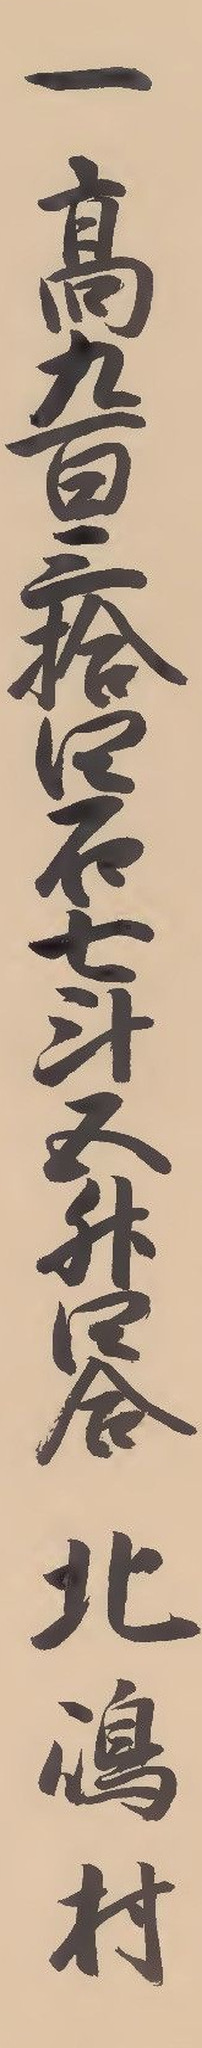一高九百三拾四石七斗五升四合北島村
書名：尾張国郷帳
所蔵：国立公文書館 National Archives of Japan
